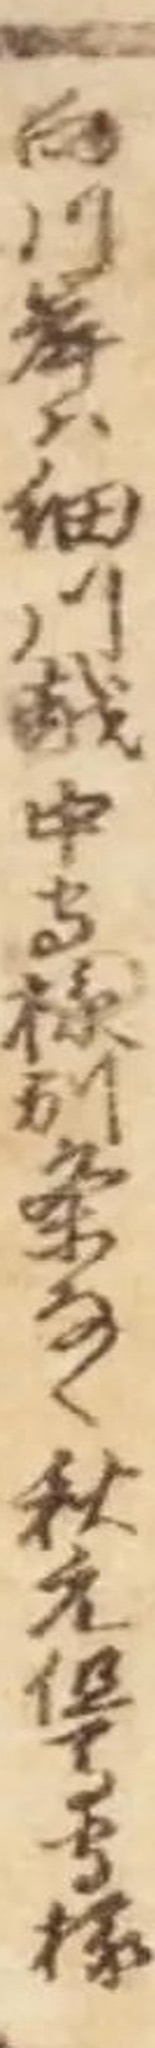向川岸は細川越中守様別条なく秋元但馬守様
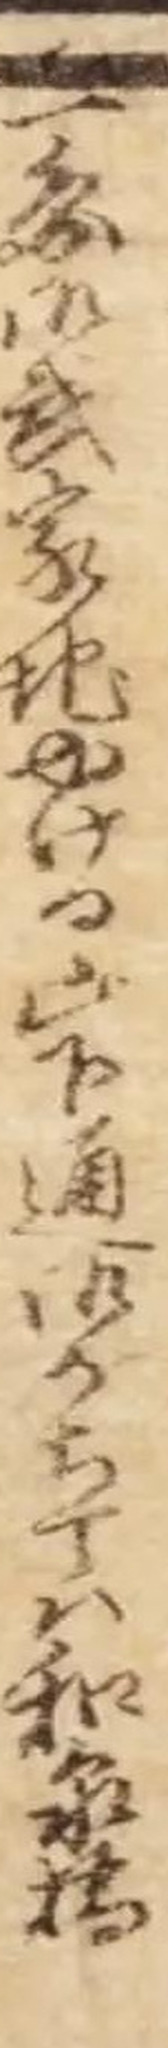一円御武家地やける山下通御かち丁は和泉橋
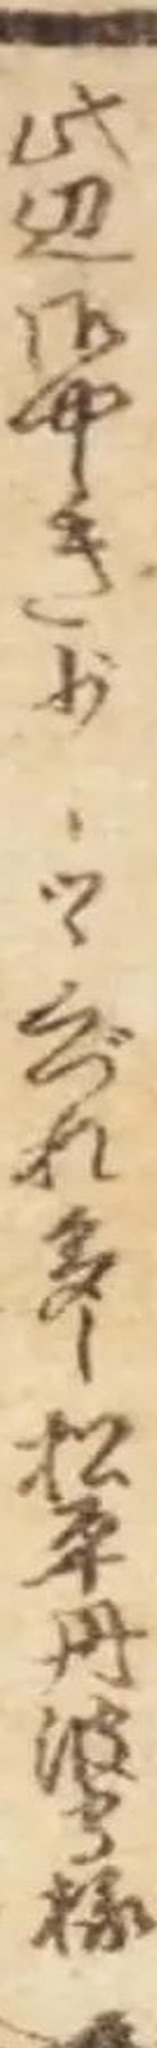此辺御やしき少ツヽくづれ多し松平丹波守様
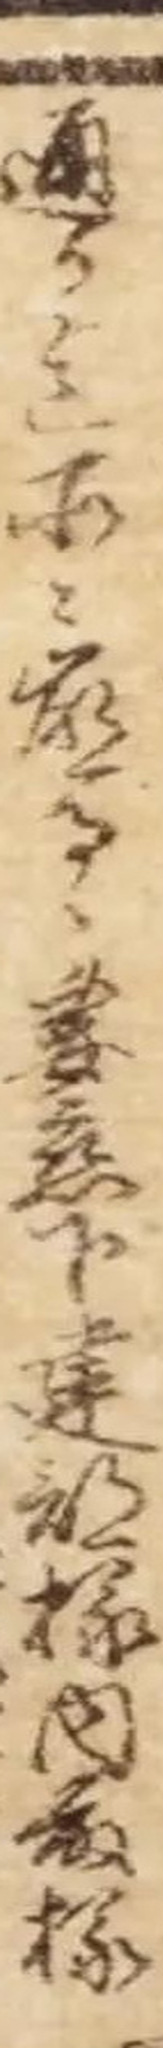通り迄所〻崩るゝ妻恋下建部様内藤様
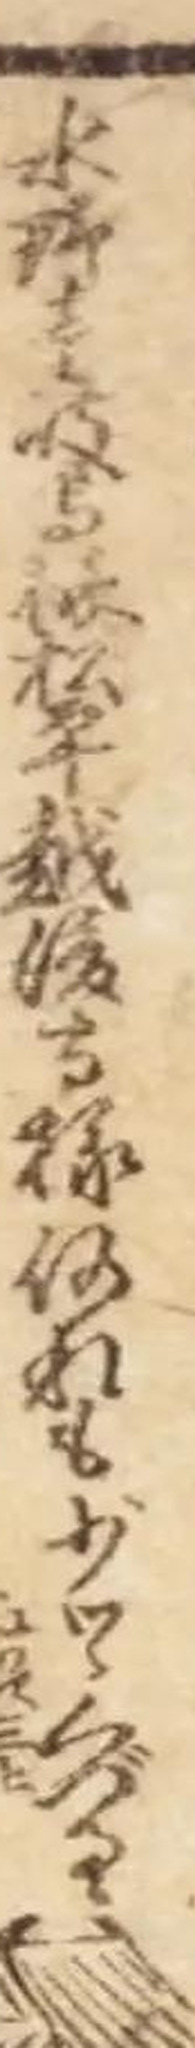水野壱岐守松平越後守様何れも少ツヽくずるゝ
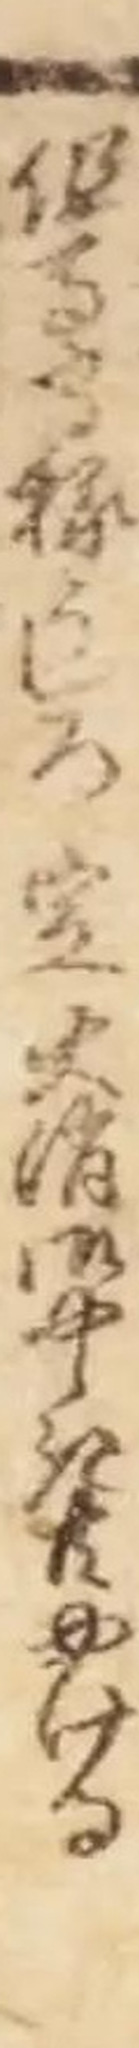但馬守様うしろ定火消御やしき共やける
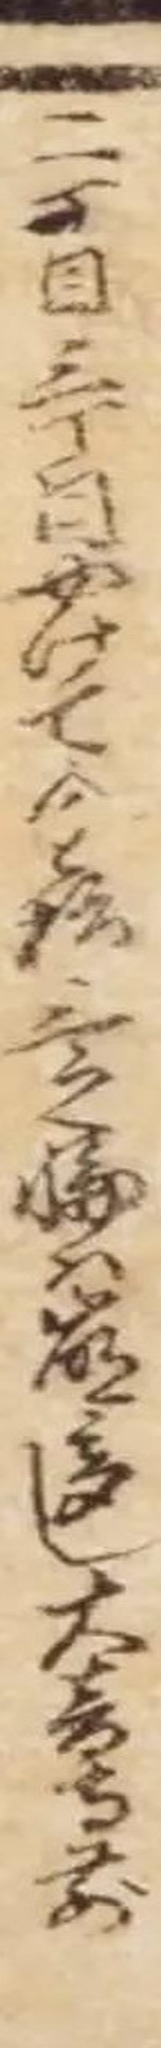二丁目三丁目やけて金杉三之輪は崩多し大音寺前
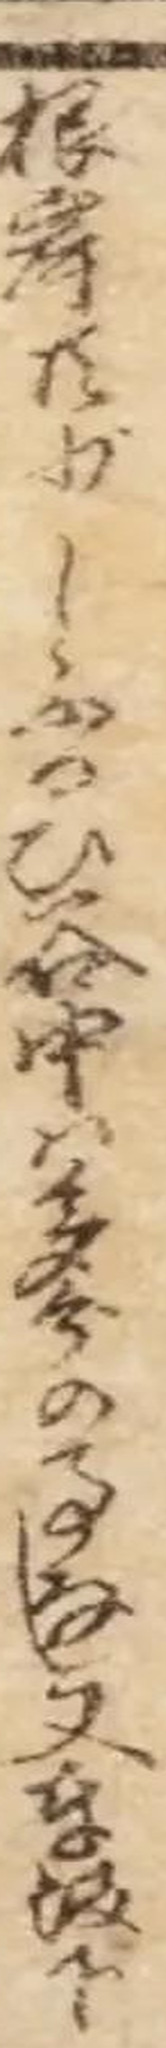根岸共少しふるひ谷中は多分の事なし又車坂下
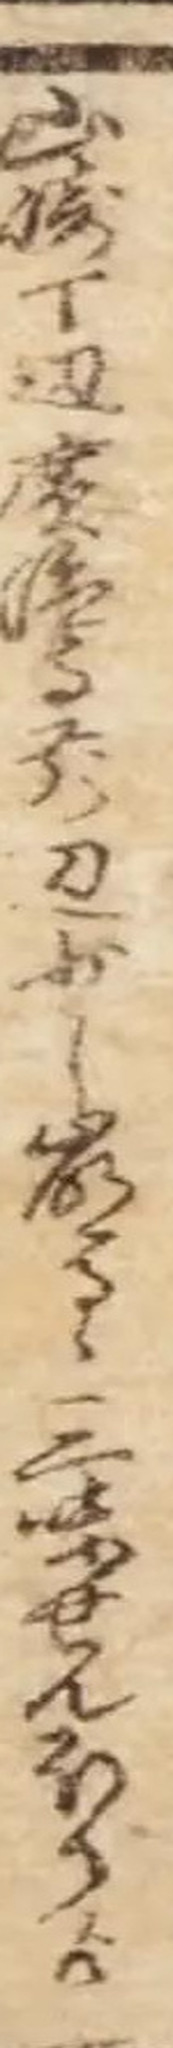山崎丁辺広徳寺前辺少し崩るゝ三味せんほりより
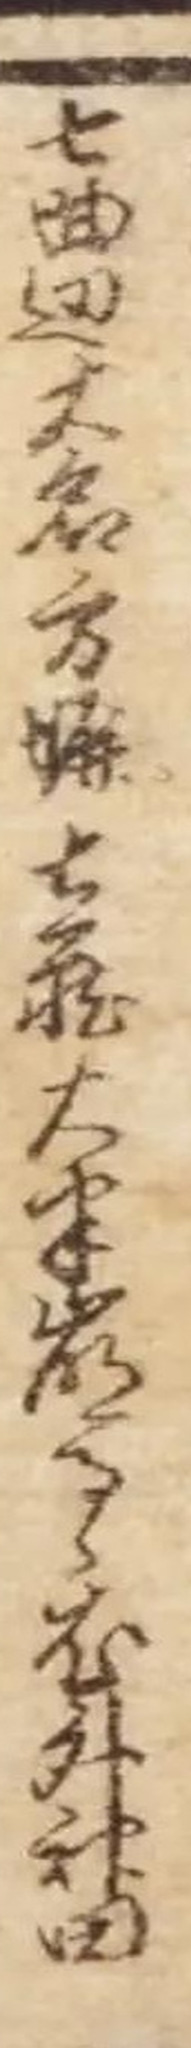七曲辺大名方塀土蔵大半崩るゝ尤外神田
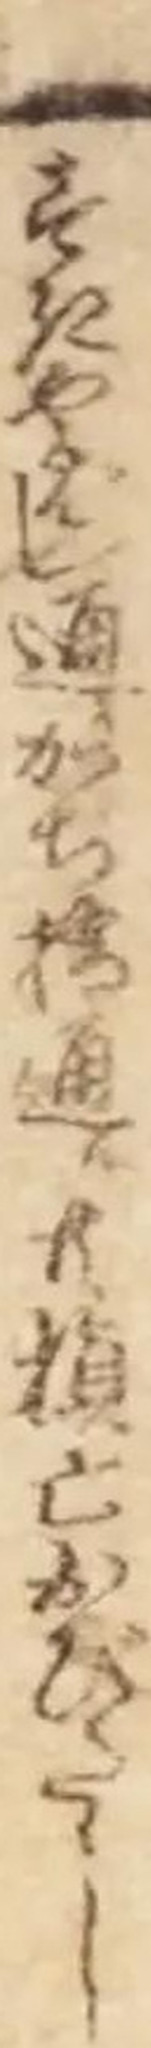すきやばし通りかち橋通り共損亡おびたゞし
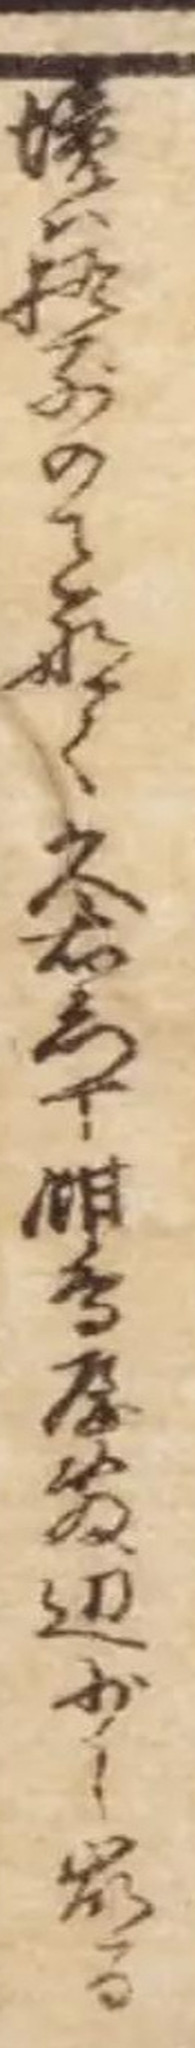境は格前のことなく久右え門丁餌鳥屋敷辺少し崩る
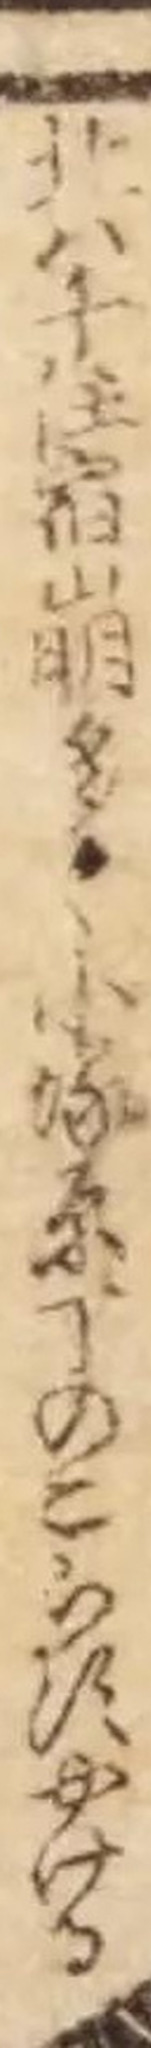北は千住宿崩多く小塚原丁のこらずやける
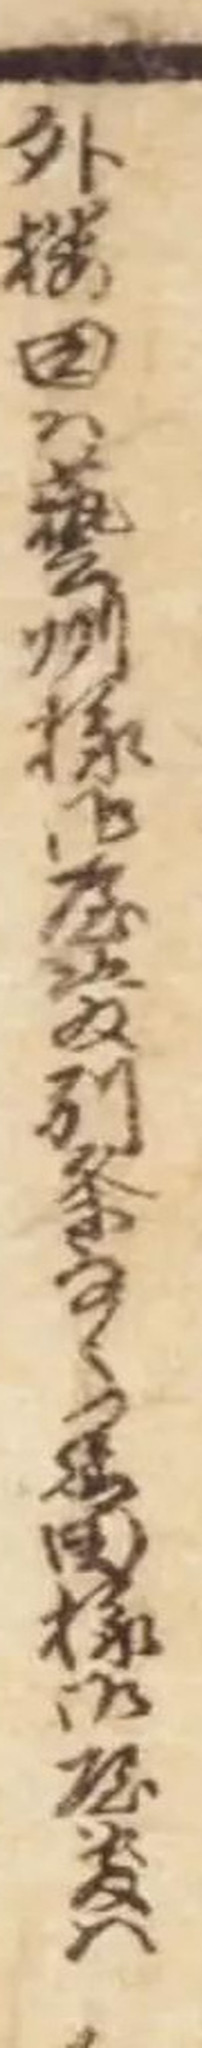外桜田は芸州様御屋敷別条なく黒田様御屋敷は
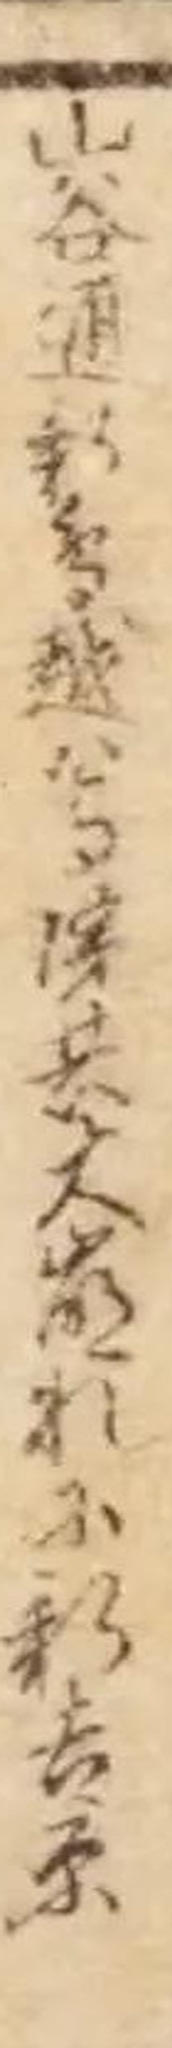山谷通新鳥越は寺院共大崩れに新吉原
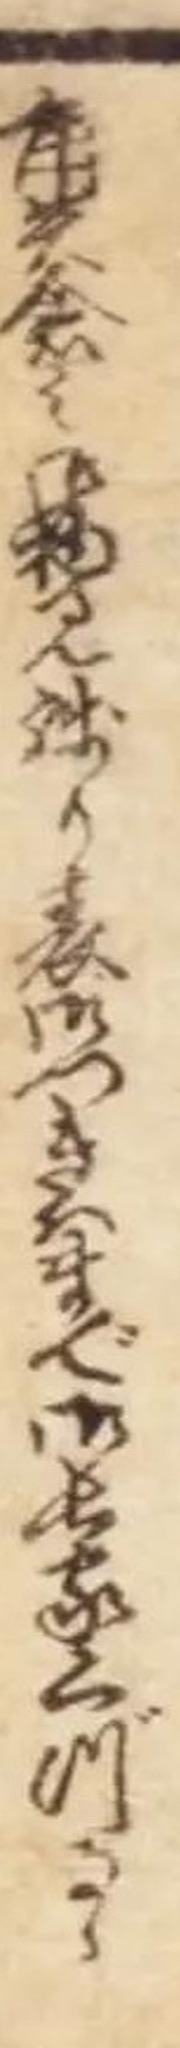角矢倉之御物見残り表御門きはまで御長家くづるゝ
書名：御江戸関八州大地震出火巨細記
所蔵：国立国会図書館 National Diet Library, JAPAN
